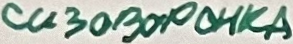сизоворонка
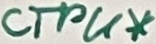стриж
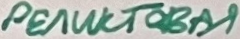реликтовая
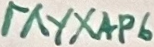глухарь
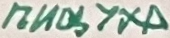пищуха
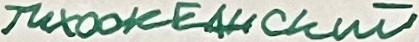тихоокеанский
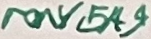голубая
